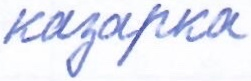казарка
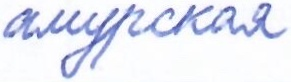амурская
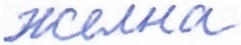желна
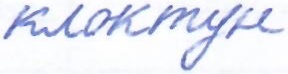клоктун
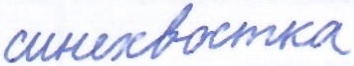синехвостка
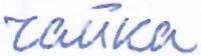чайка
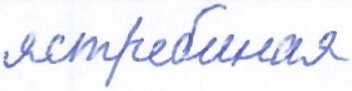ястребиная
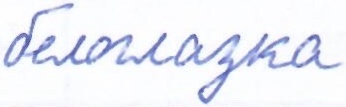белоглазка
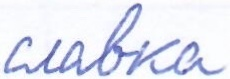славка
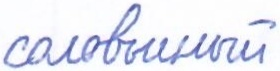соловьиный
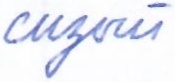сизый
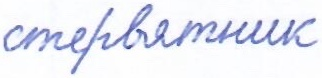стервятник
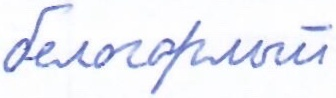белогорлый
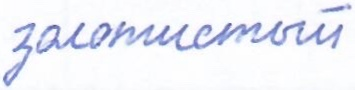золотистый
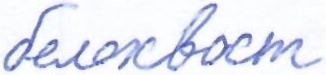белохвост
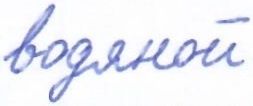водяной
